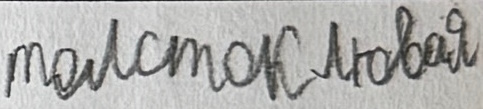толстоклювая
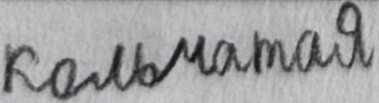кольчатая
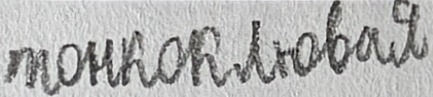тонкоклювая
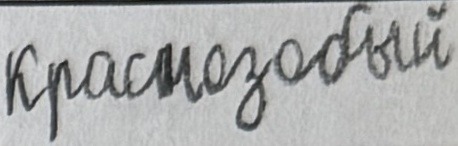краснозобый
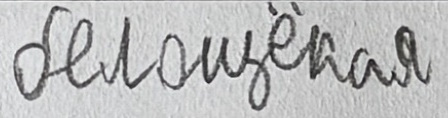белощёкая
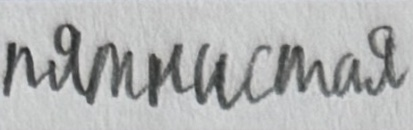пятнистая
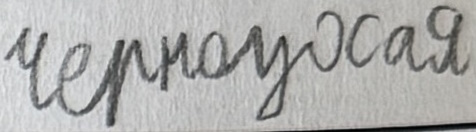черноухая
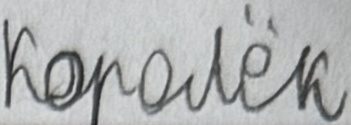королёк
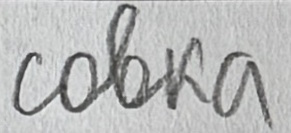совка
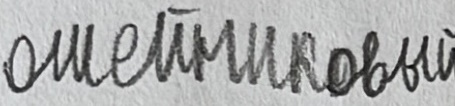ошейниковый
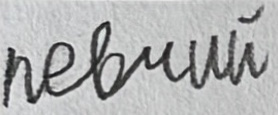певчий
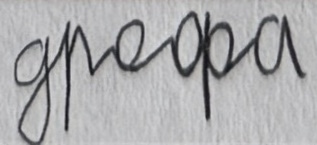дрофа
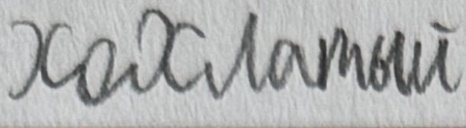хохлатый
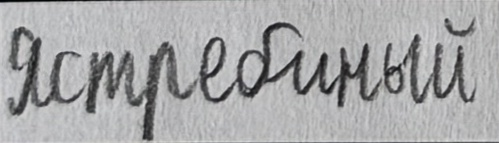ястребиный
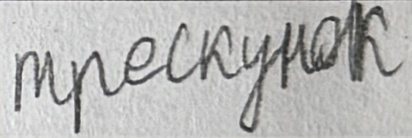трескунок
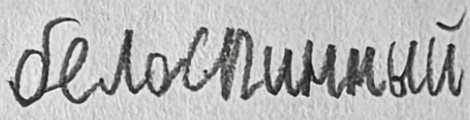белоспинный
